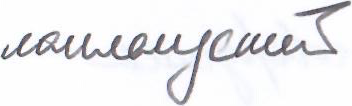лапландский
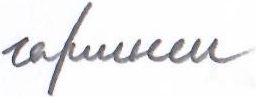гаршнеп
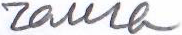чомга
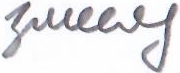змееяд
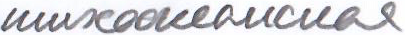тихоокеанская
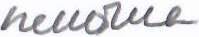пеночка
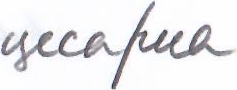цесарка
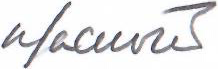красный
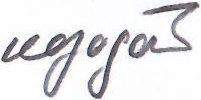козодой
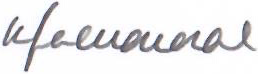красноногая
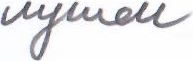луток
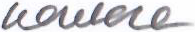конюга
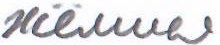жёлтая
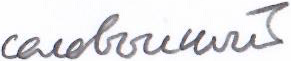соловьиный
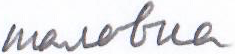таловка
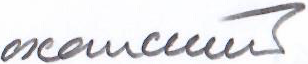охотский
